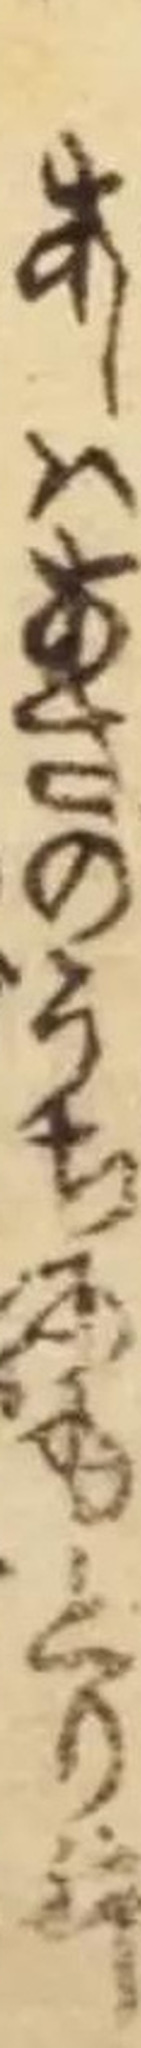あしはあさのうちにもとり升
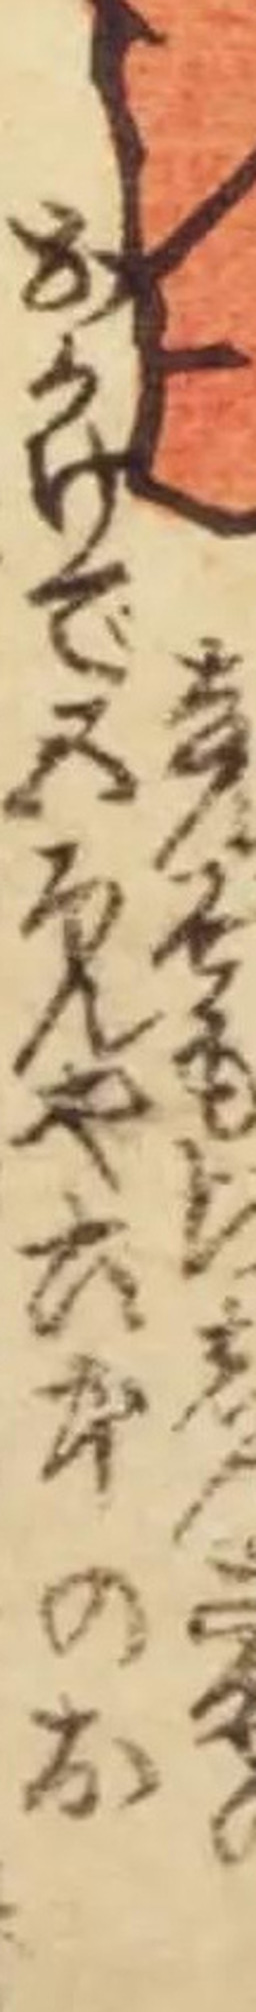おかけで五ほんや六本のお
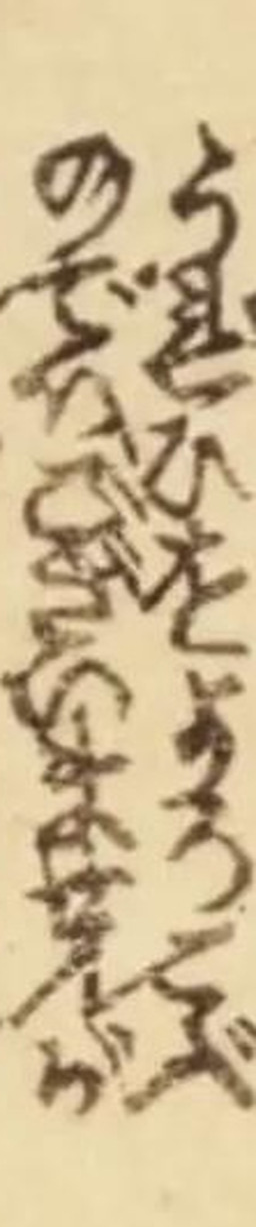のではございませんが
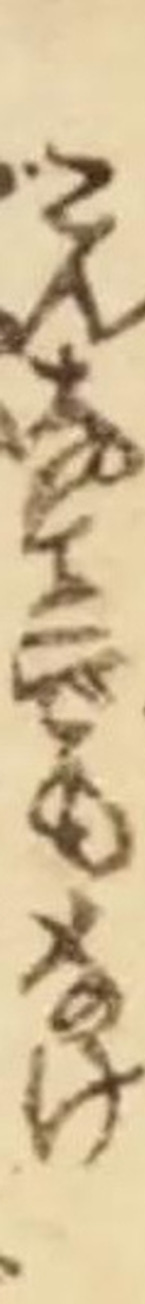こんなことでもなけ
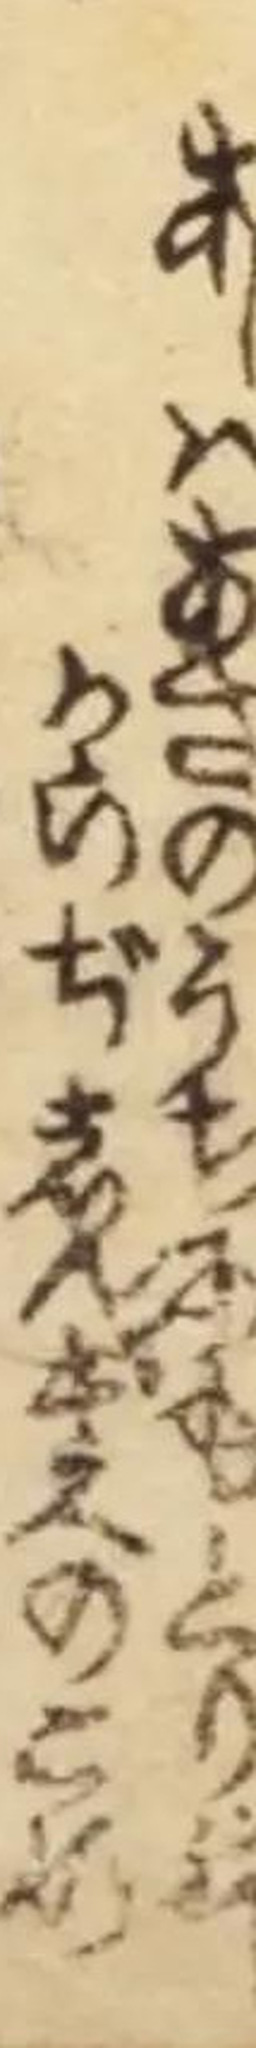からぢしんえのこめ
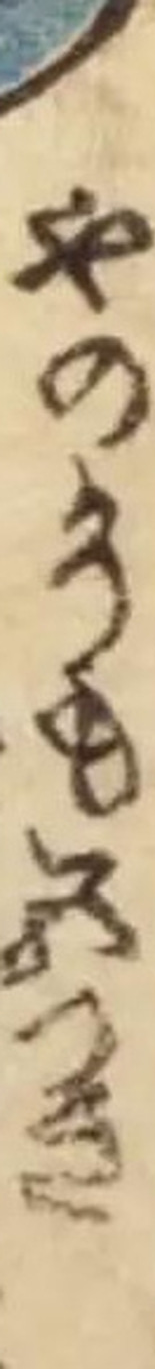やのかりも五つき
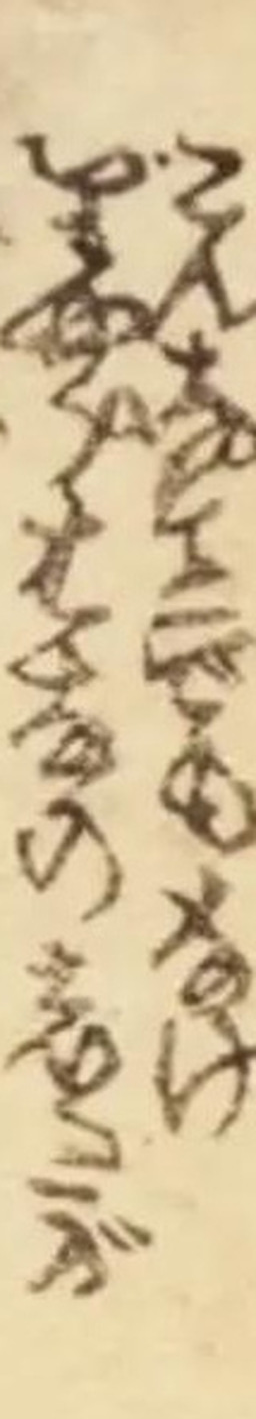りやアはなのしたが
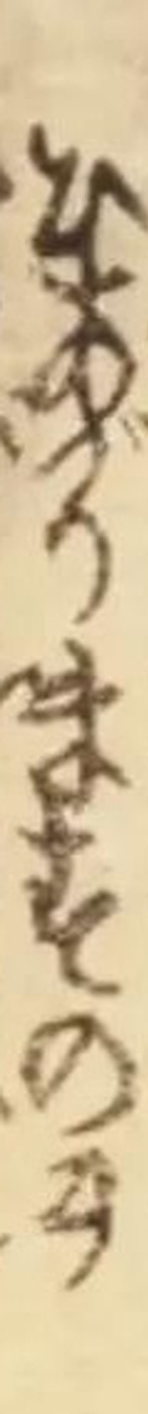ひあがりますのヲ
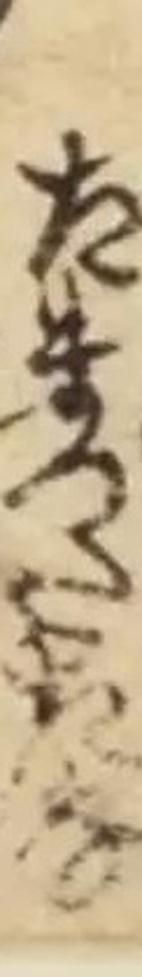たまつたたな
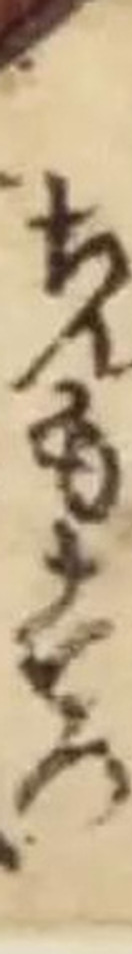ちんもすつ
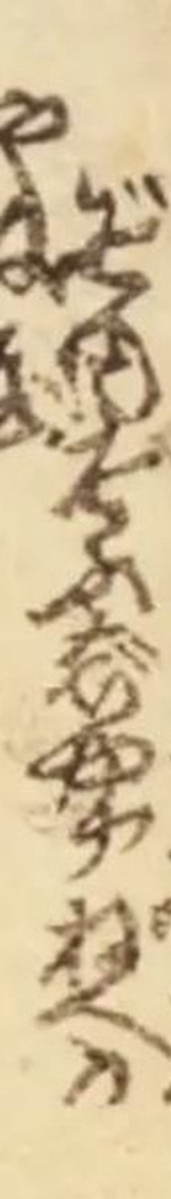ぞねそふじゃアねへか
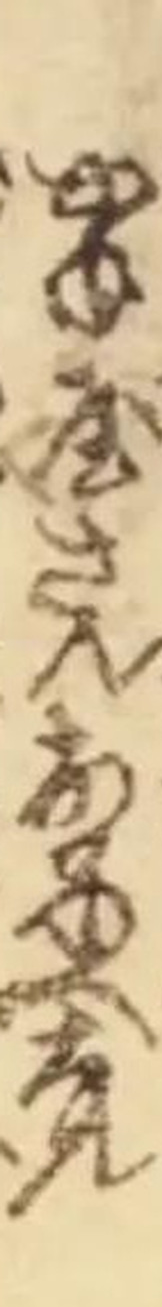やね屋さんおめへなん
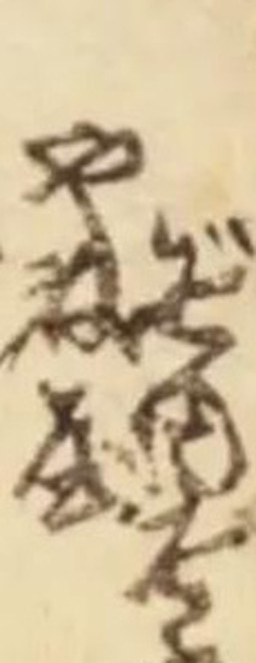やね屋
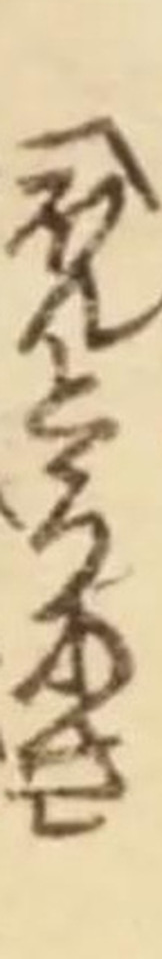「ほんとうに
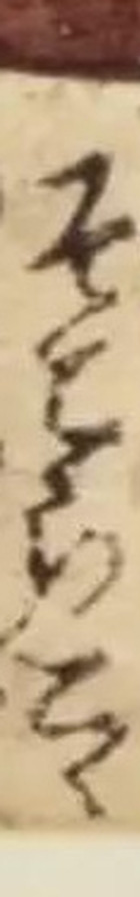そこらこゝ
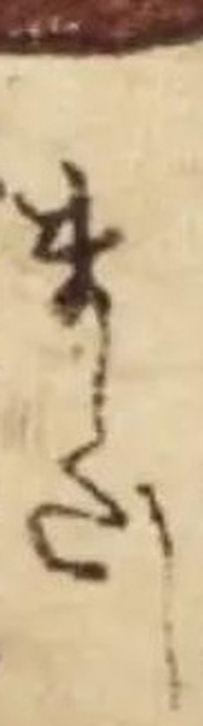ました
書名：生捕ました三度の大地震
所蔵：国立国会図書館 National Diet Library, JAPAN
